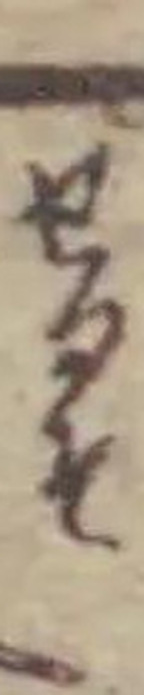せるそ
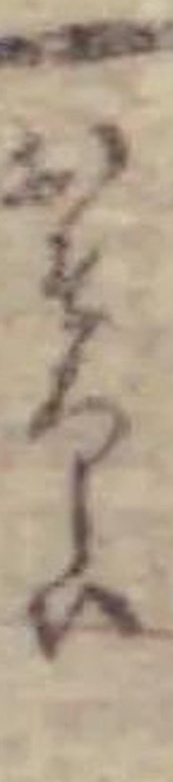おそろしい
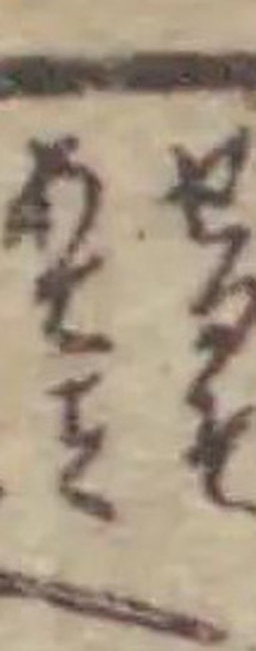あてこと
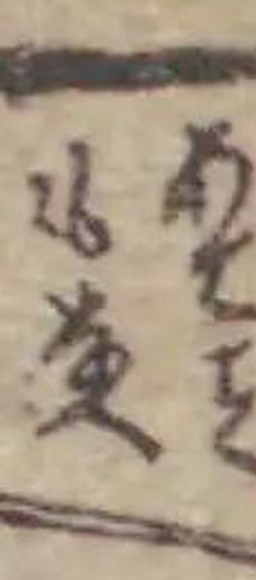もなへ
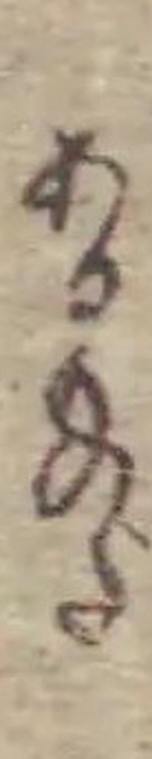あるものた

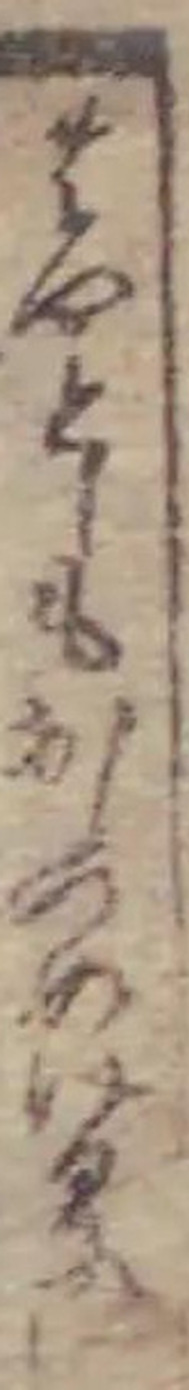はやとしもおしつめけるに
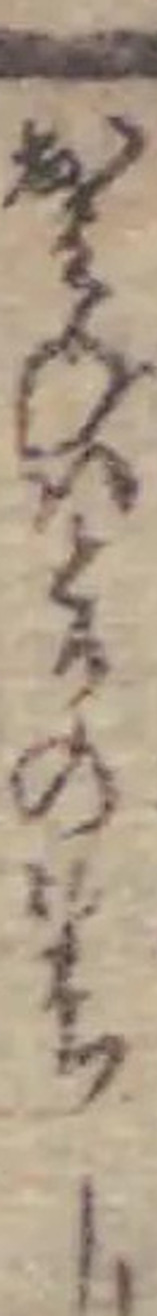おみねはとりのまち
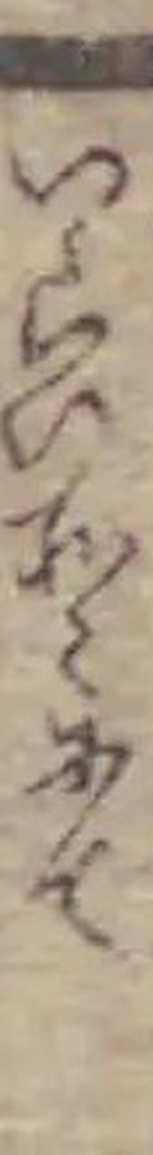いらい所々にて
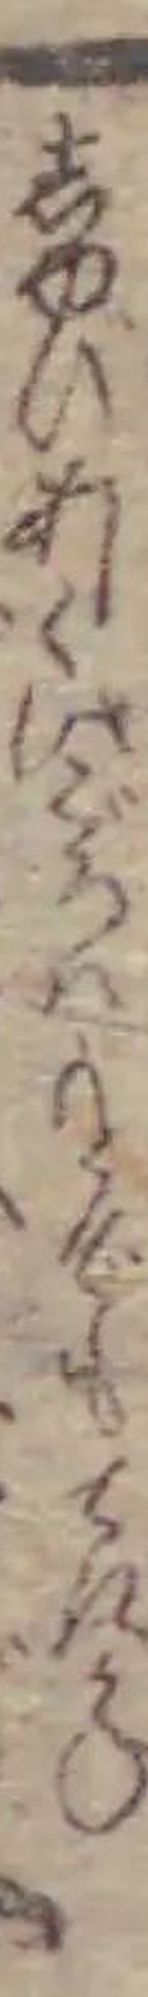しゆひあしく此ごろはもとでもてきかね
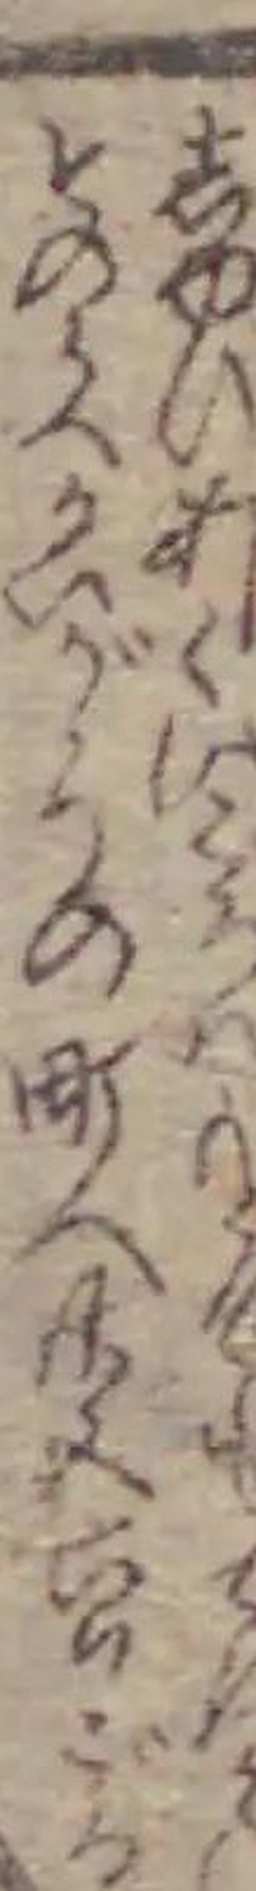そのうへかいがゝりの町人廿五六日ごろ
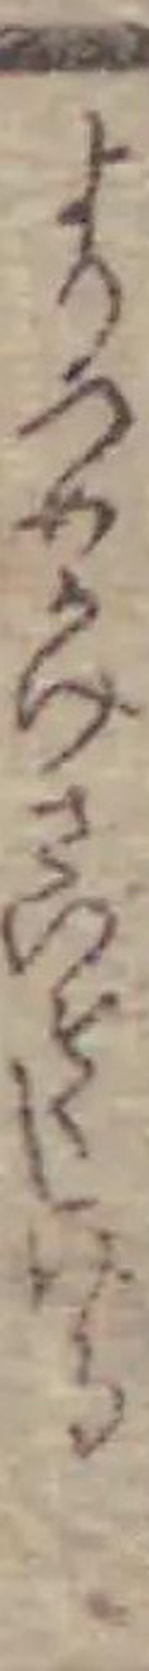よりつめかけさいそくしける
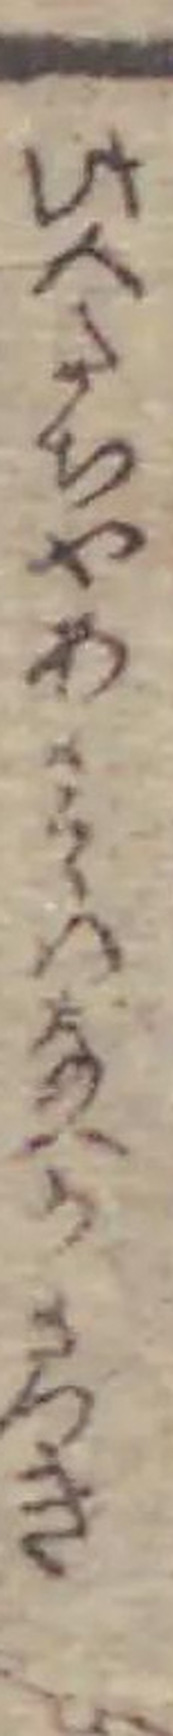此人たちやあみゝはなへかさつき
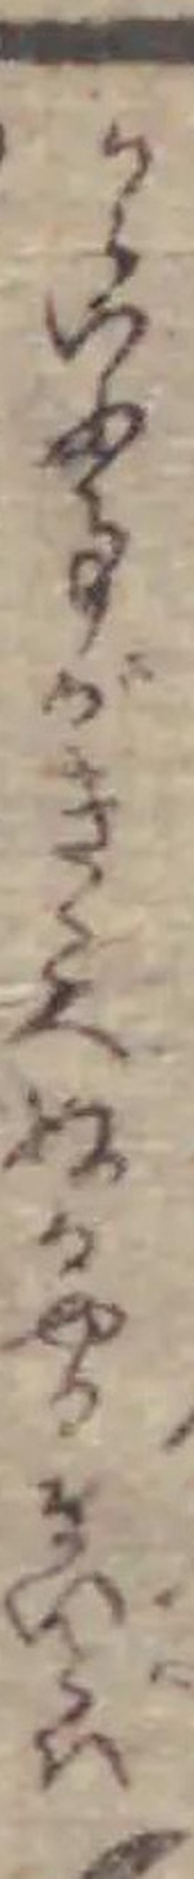からいふ事がきこへぬかやるまいとは
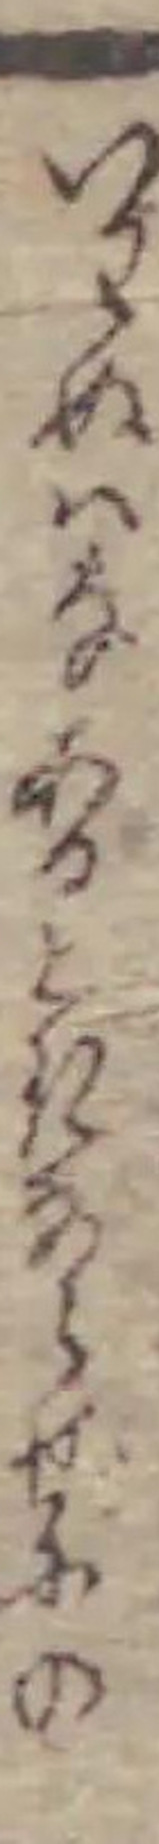いわぬはなあるときならぜにの
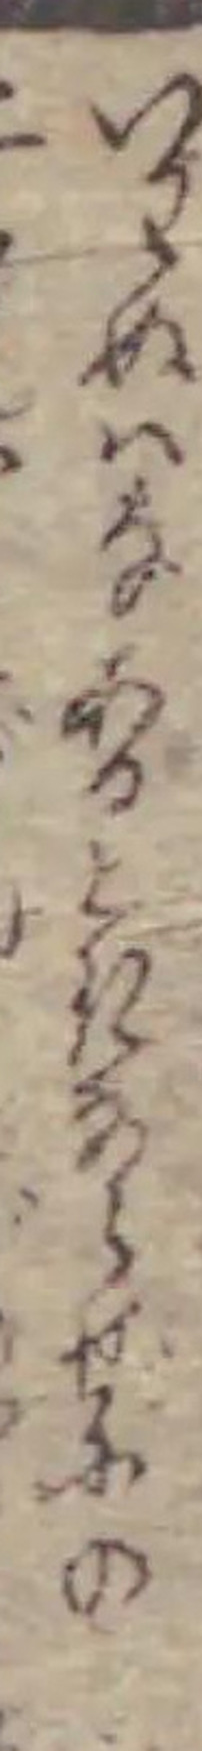いわぬはなあるときならぜにの
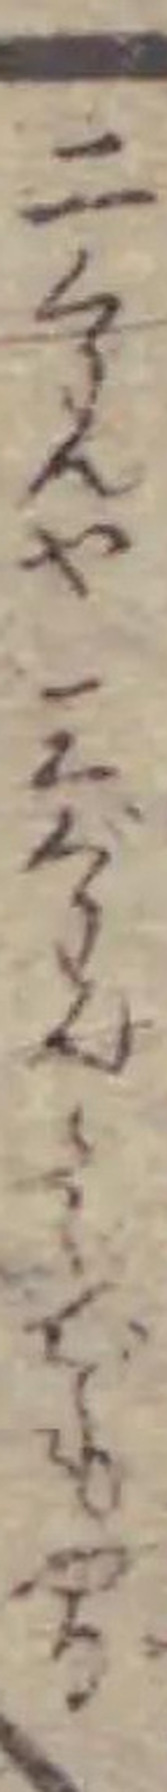二くわんやさんぐわんたふでもやる
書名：飛た間違矢口噂 2巻
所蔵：国立国会図書館 National Diet Library, JAPAN
